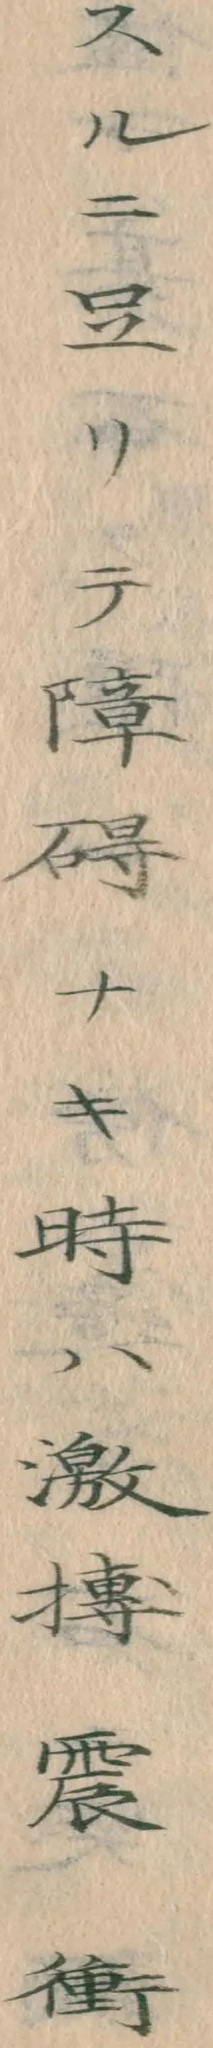スルニリテ障碍ナキ時ハ激搏震衝
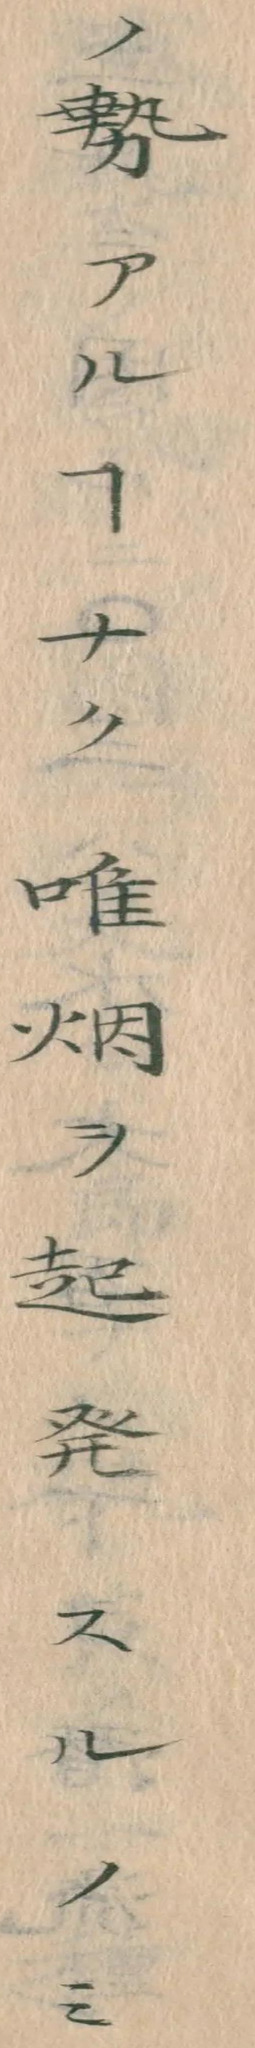ノ勢アル事ナリ唯ヲ起発スルノミ
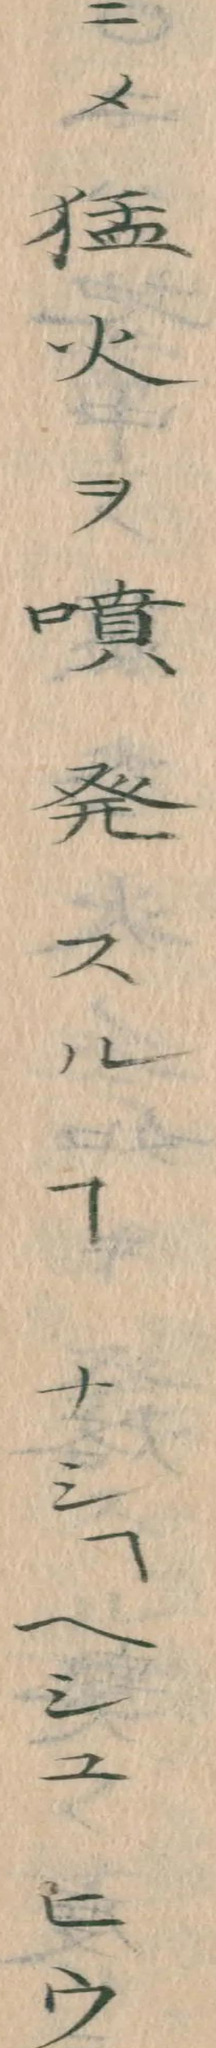ニメ猛火ヲ噴発スル事ナシ「ヘシュヒウ
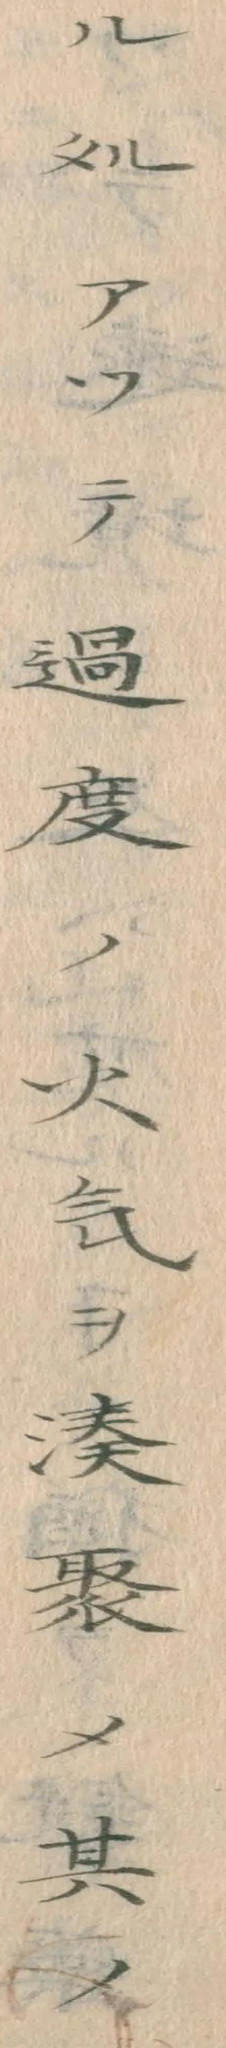ル処アツテ過度ノ火ヲ湊聚メ其ノ
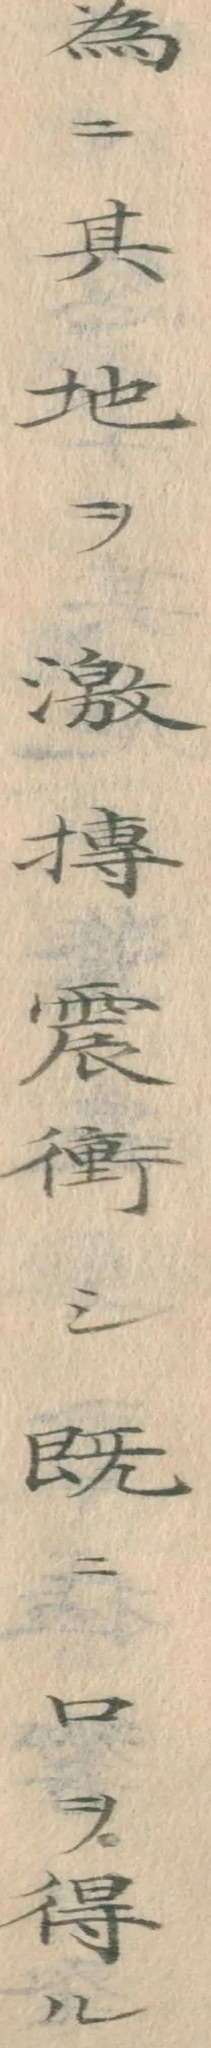爲ニ其地ヲ激搏震衝シ既ニ口ヲ得ル

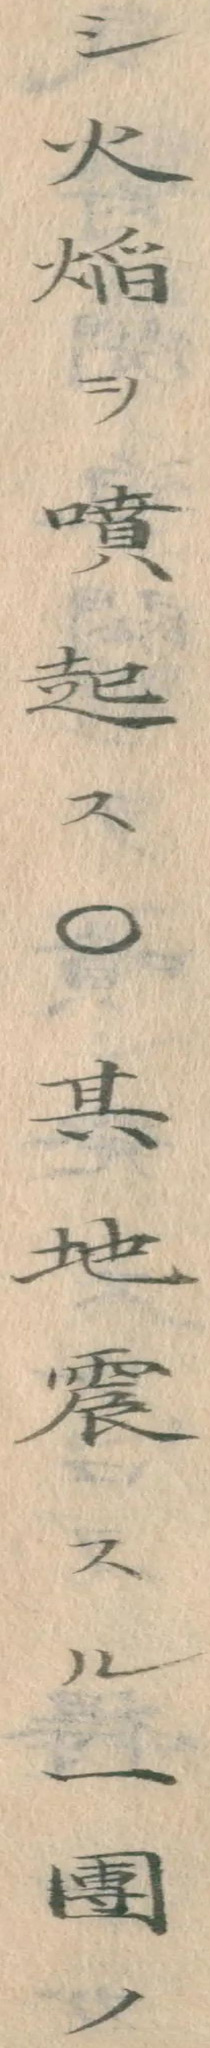シ火焔ヲ噴起ス○其地震スル一団ノ
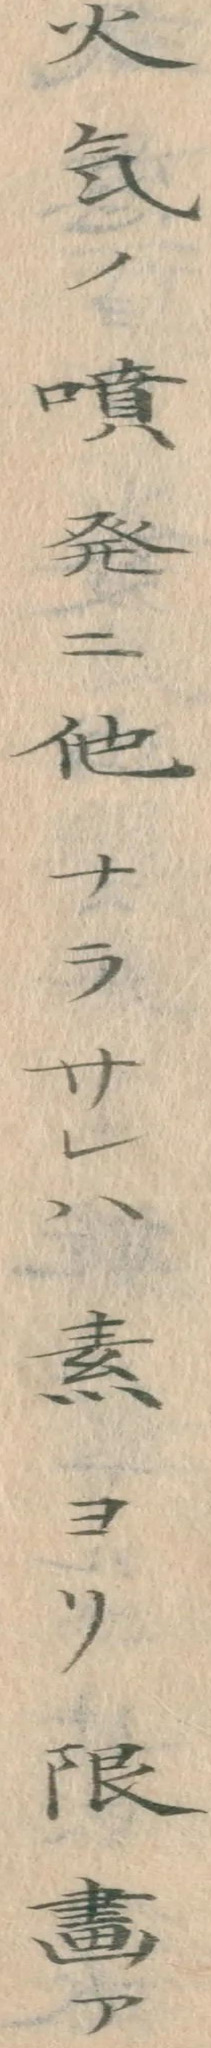火ノ噴発ニ他ナラサレハ素ヨリ限画ア
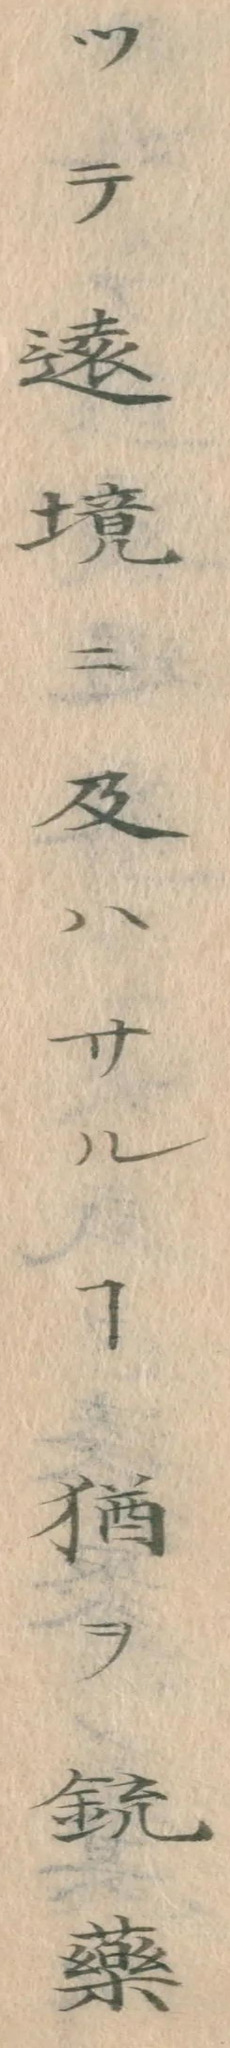ツテ遠境ニ及ハサル事猶ヲ銃薬
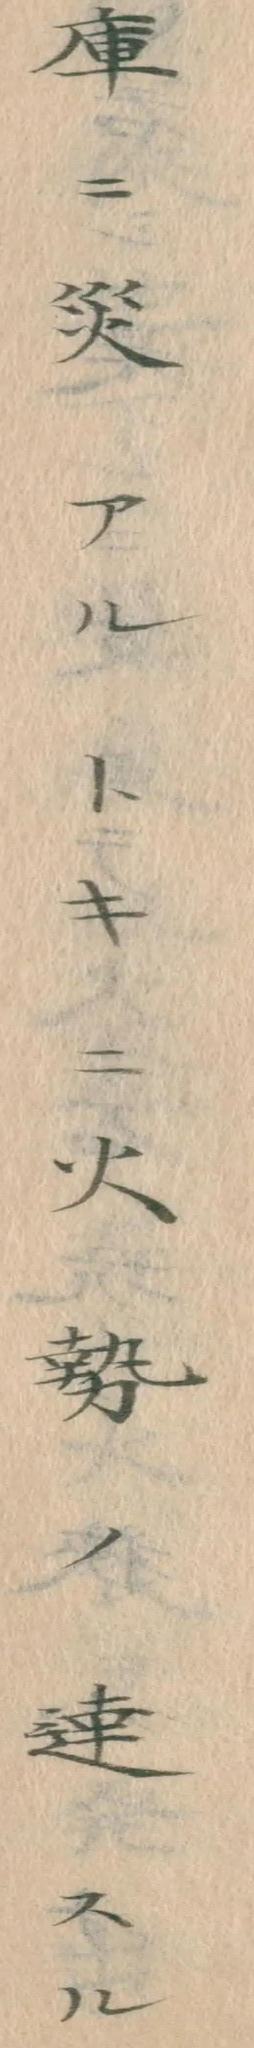庫ニ災アルトキニ火勢ノ達スル
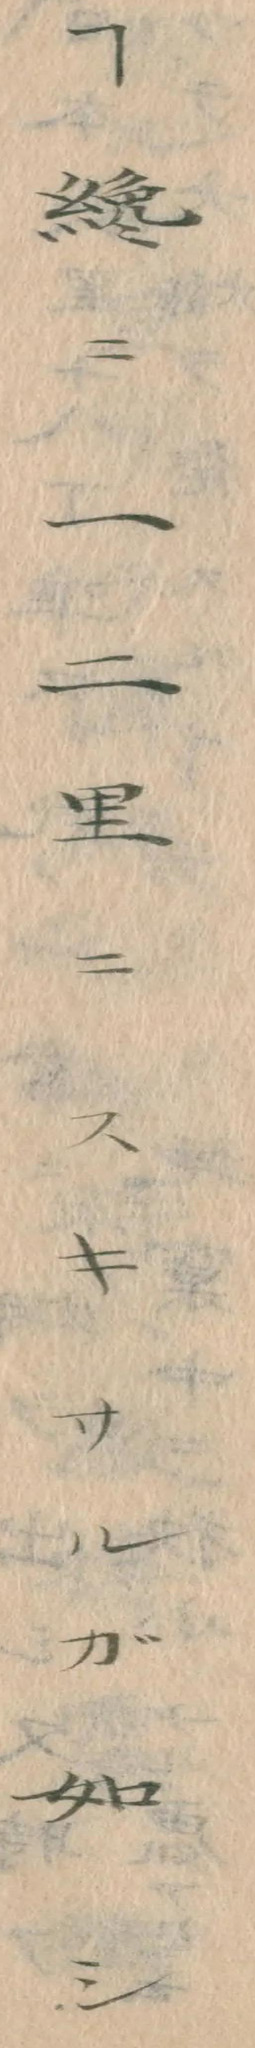事纔ニ一二里ニスキサルガ如シ
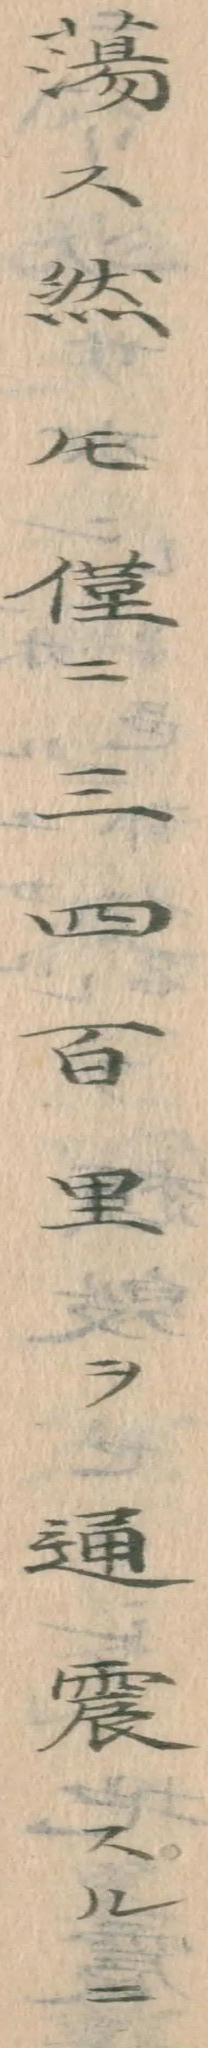蕩ス然僅ニ三四百里ヲ通震スルニ
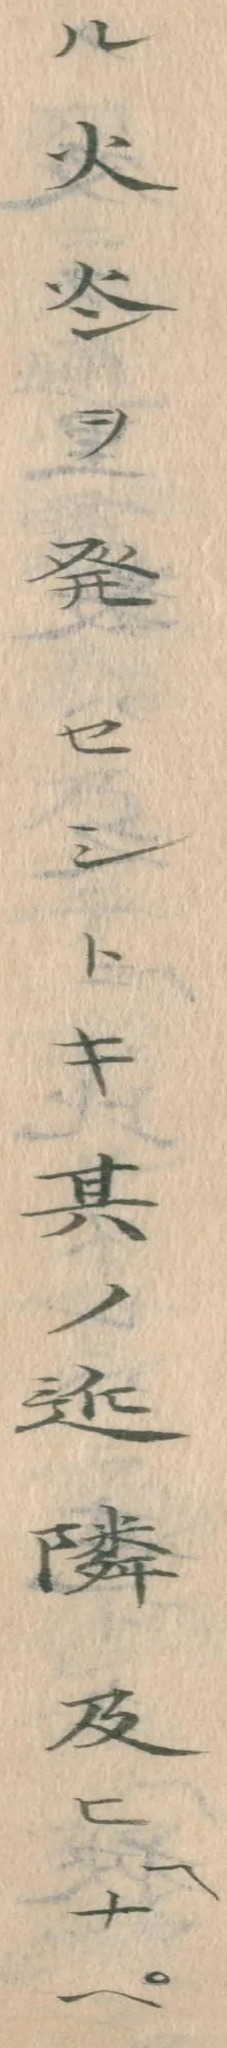ル火ヲ発セシトキ其ノ近隣及ヒ「ナペ
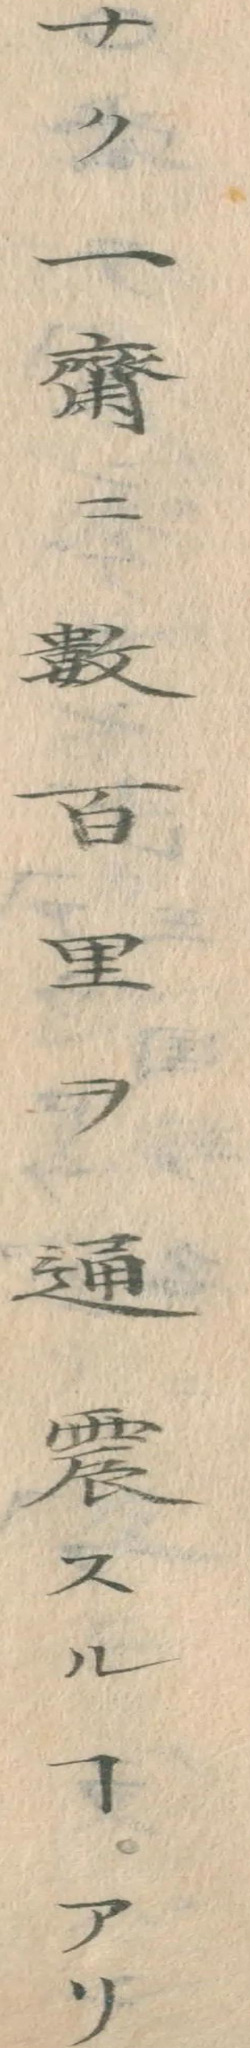ナク一斎ニ数百里ヲ通震スル事。アリ

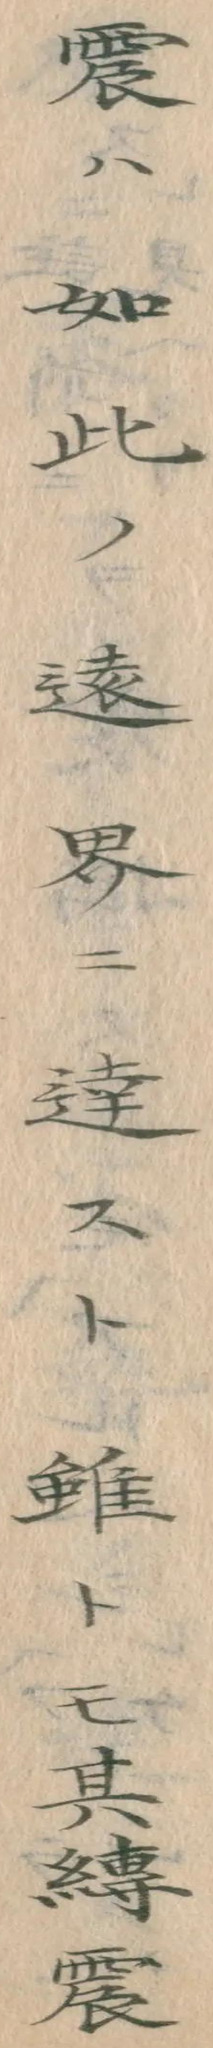震ハ如此ノ遠界ニ達スト雖トモ其縛震
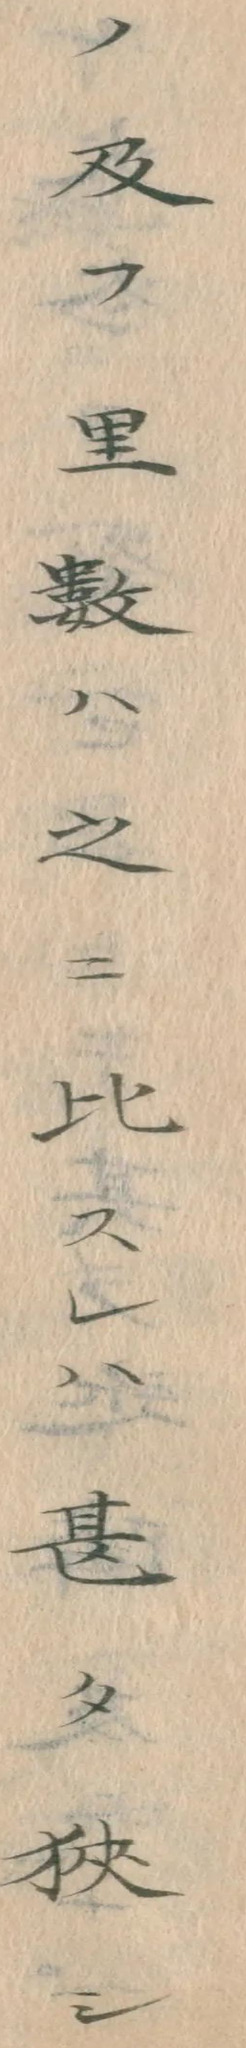ノ及フ里数ハ之ニ比スレハ甚タ狭シ
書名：輪池叢書. 12
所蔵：国立国会図書館 National Diet Library, JAPAN
